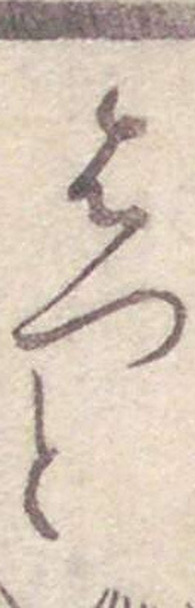はつと
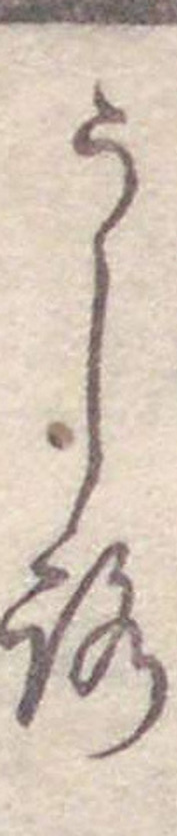うしろ

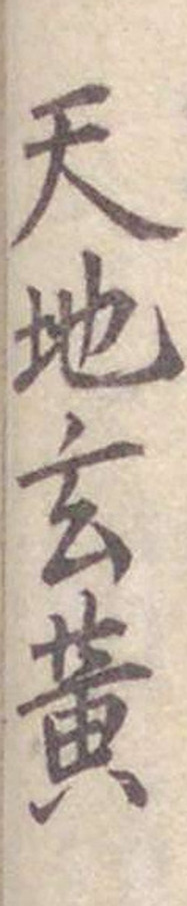天地玄黄
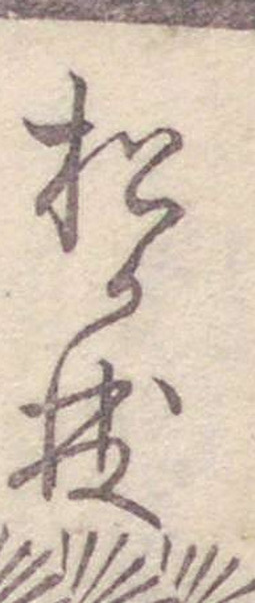松か枝
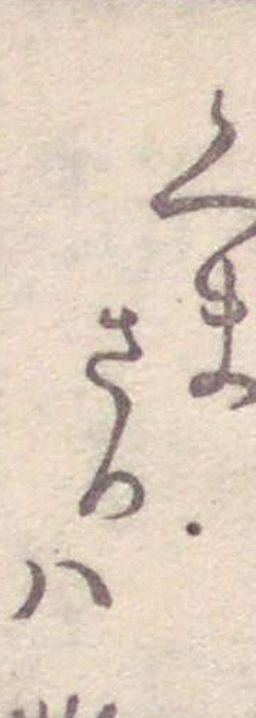さかは
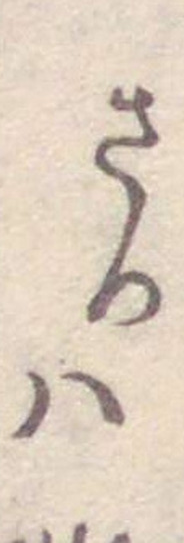さかは
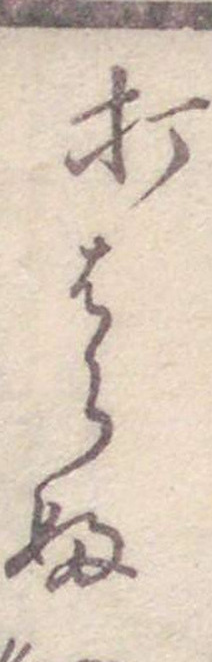打はらふ
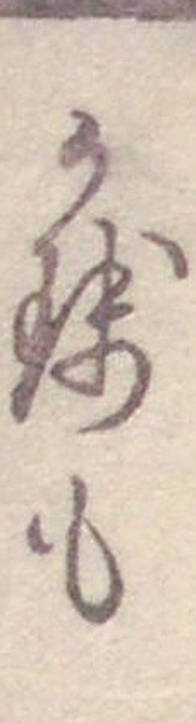か銭も
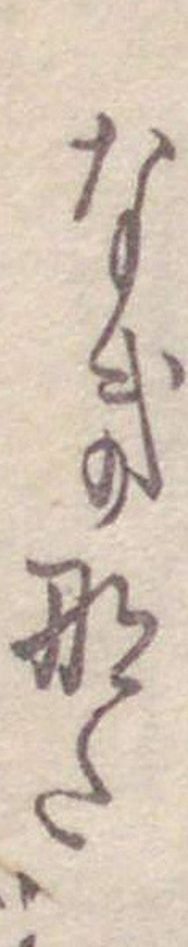なきなた

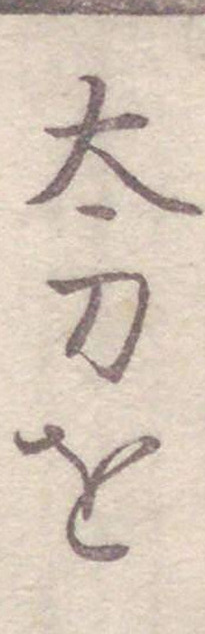太刀を
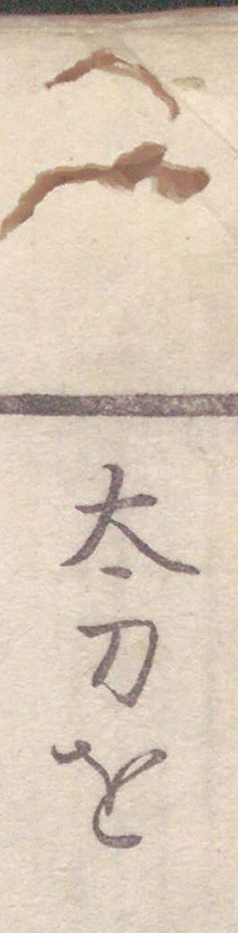太刀を
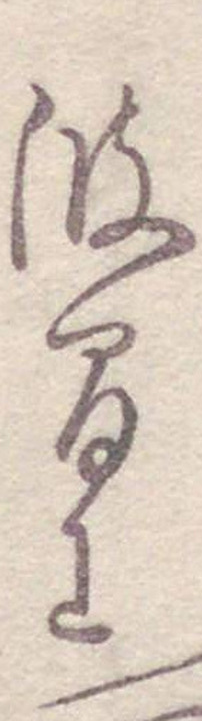波間に
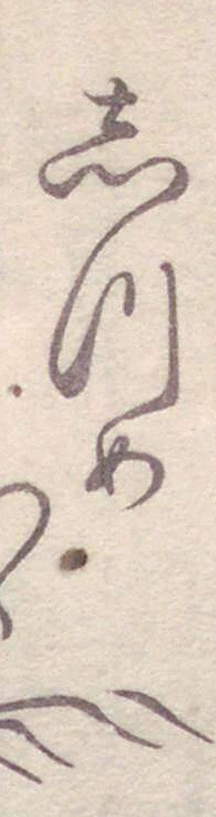しつめ
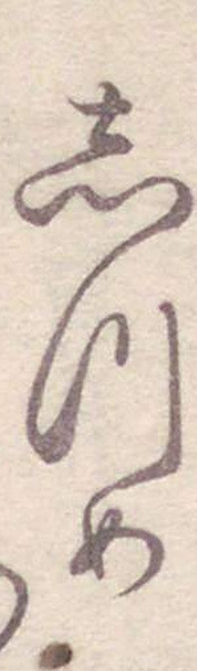しつめ
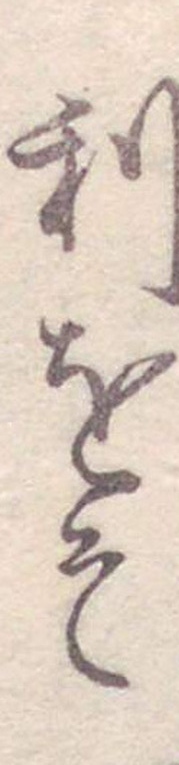利をそ
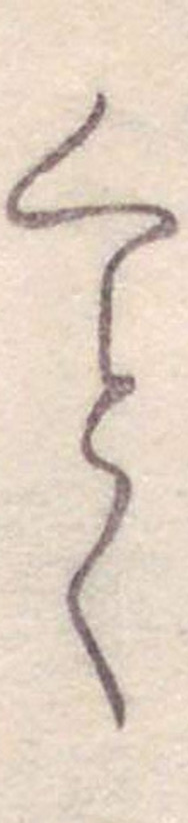くとく
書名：繪本八十宇治川
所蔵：九州大学中央図書館 国文学研究資料館
